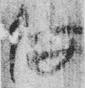居
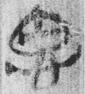思
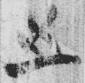之
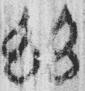○（茲）
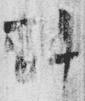信
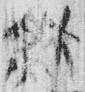然
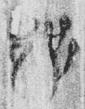○（技）
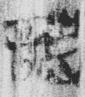○（詐）
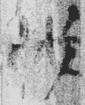○（豺）
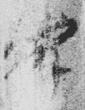虎
